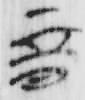○（期）
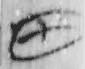甲
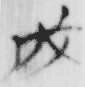戌
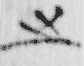之
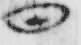日
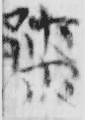郯
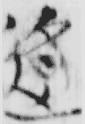○（路）
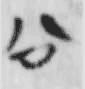公
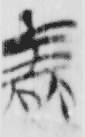蛙
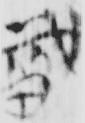戠
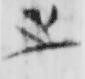之
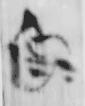爲
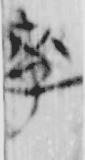李
